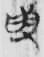受
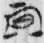○（期）
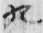九
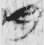月
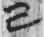己
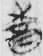梄（酉）
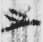之
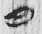日
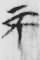不
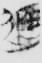𬨭（將）
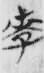李
